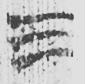三
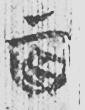百
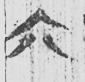六
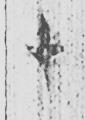十
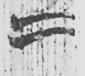二
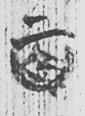百
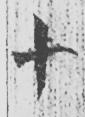七
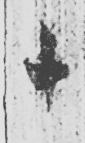十
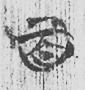百
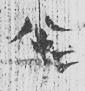八十=
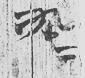九十=
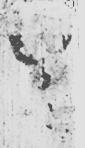四十=
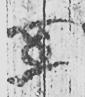五
